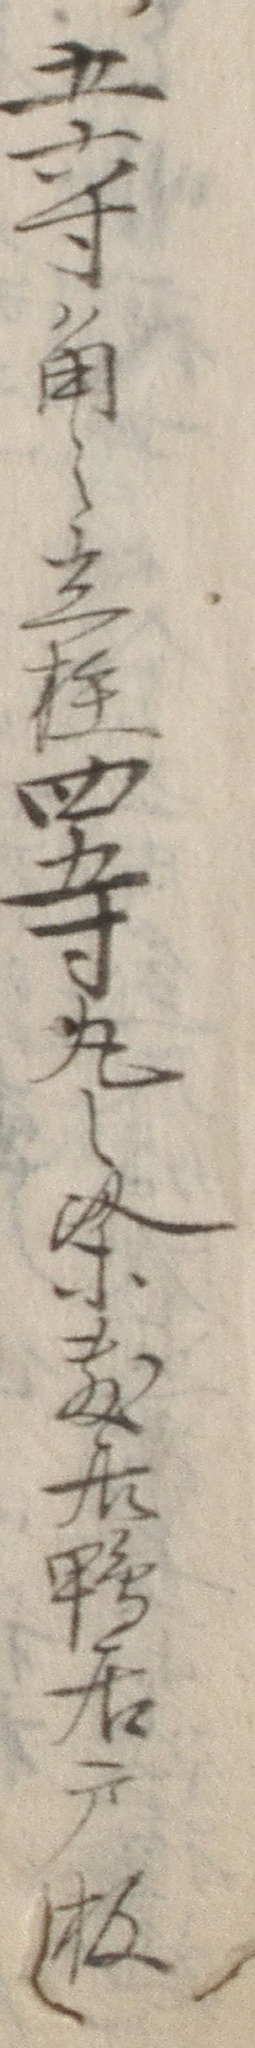五六寸角之立柱四五寸丸之梁敷居鴨居戸板
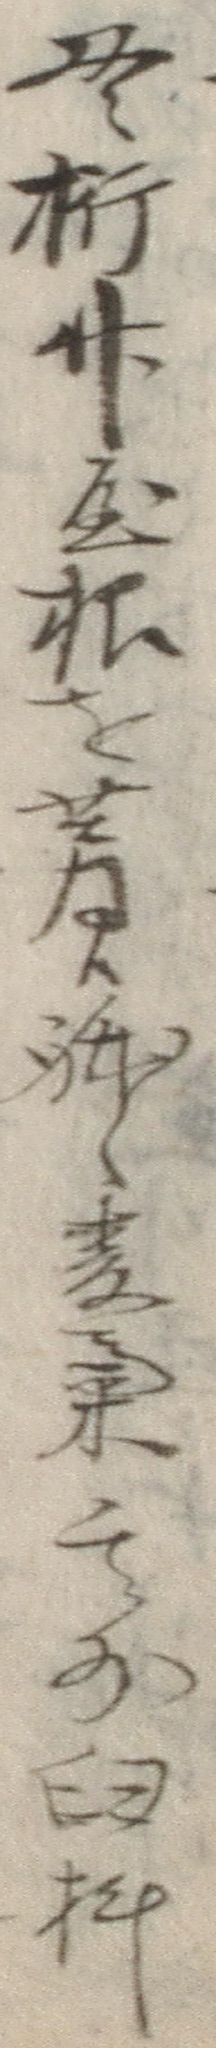畳桁竹屋根を葺候躰之麦藁其外臼杵
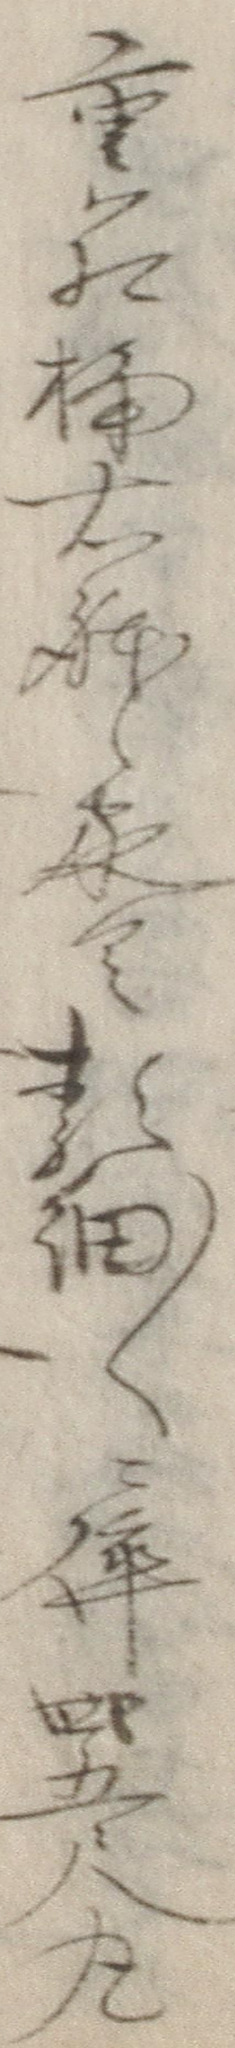重箱桶右躰之家具類細〳〵ニ砕四五尺丸
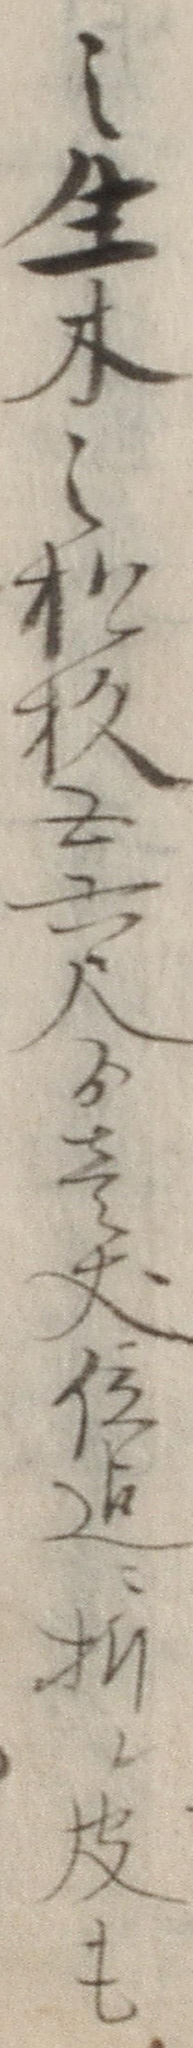之生木之松杉五六尺ゟ壱丈位迄ニ折レ皮も
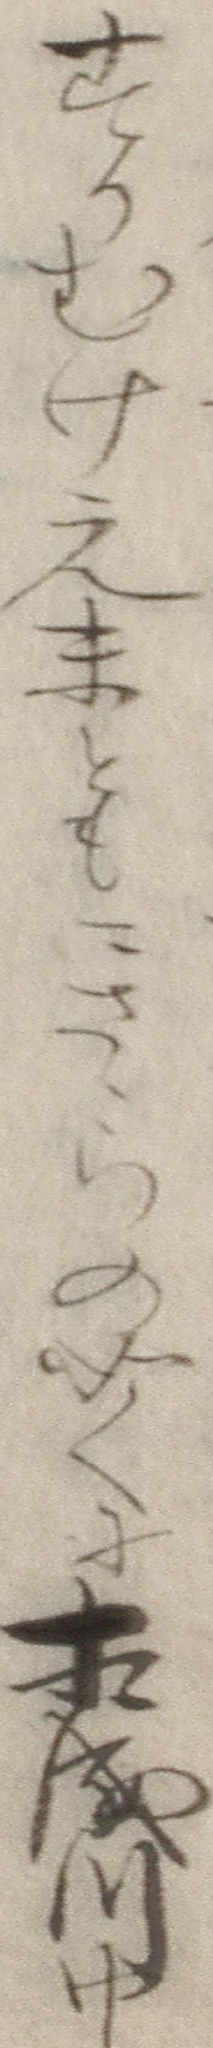すりむけ元末ともニさゝらの如くに相成川中
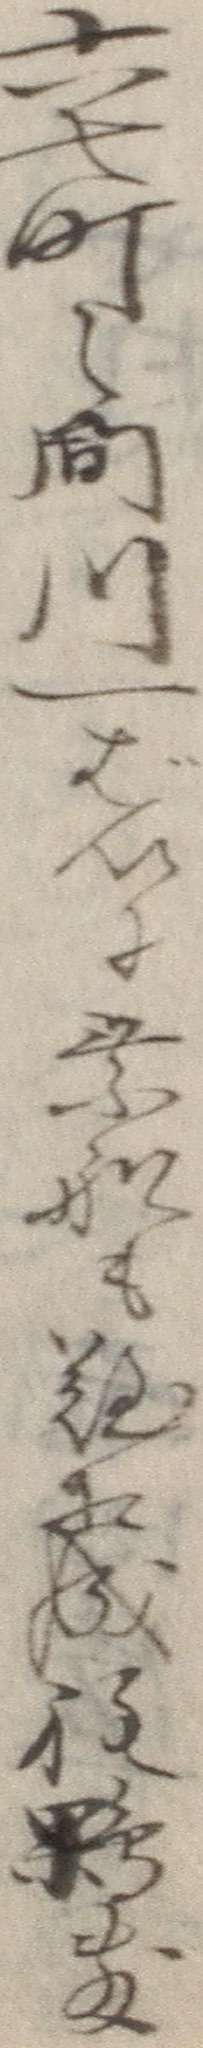六七町之間川一ばいに乗舩も難相成程夥敷
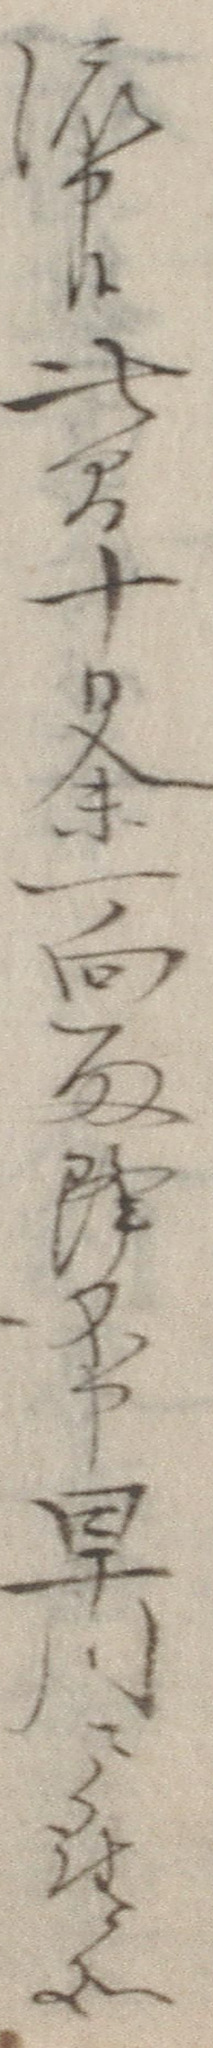流申候此間十日余一向雨降不申旱川ニ御座候処
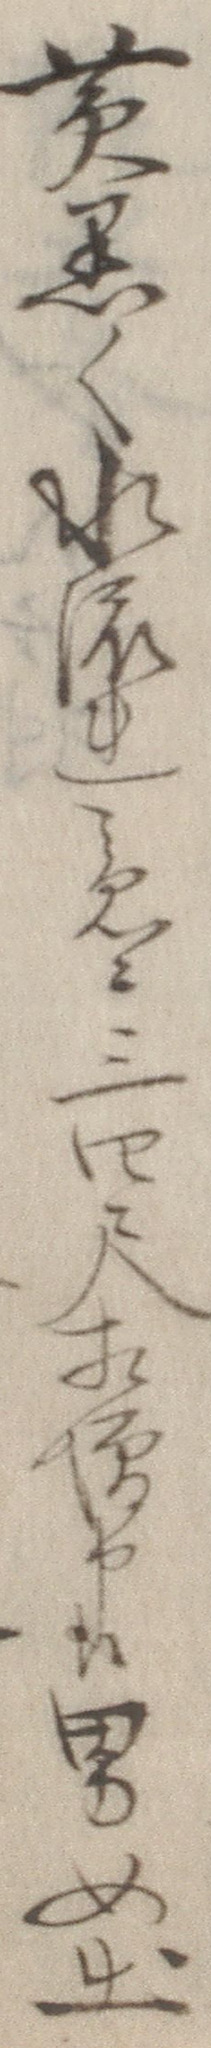黄黒く水流れ急ニ三四尺相増申候男女出
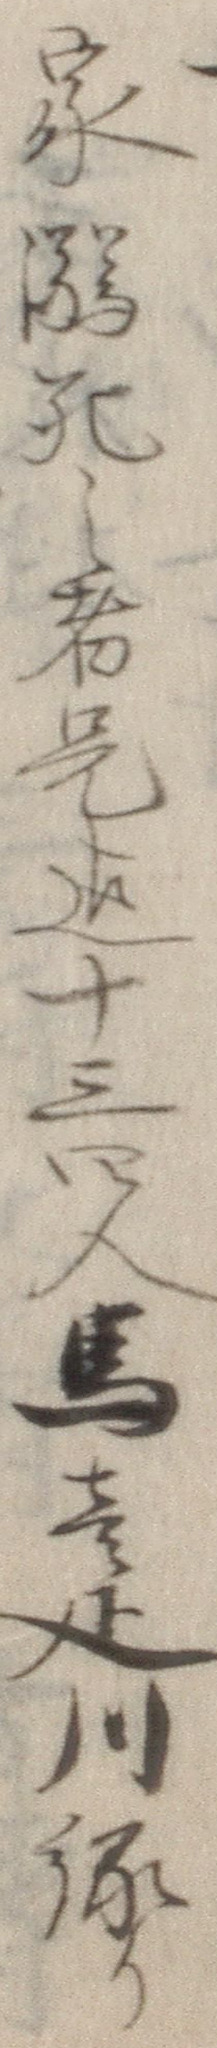家溺死之者是迄十三四人馬壱疋川縁り
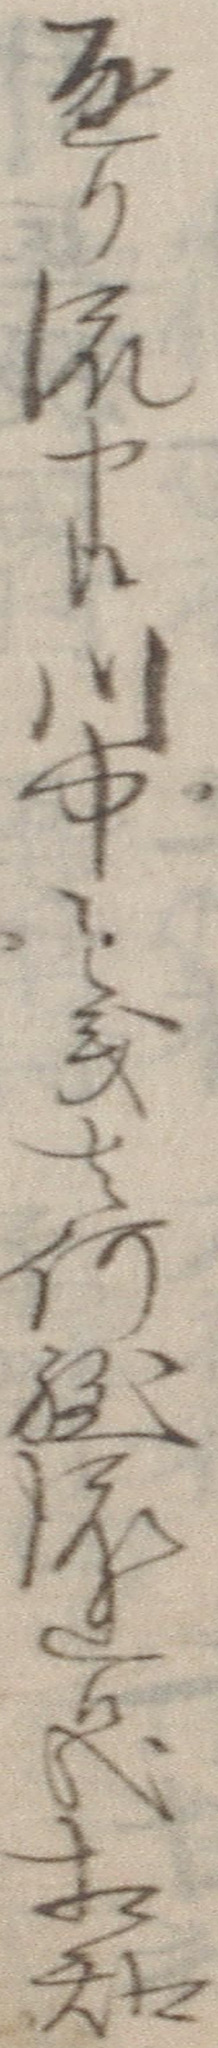通り流申候川中之義は何程流れ候哉相知
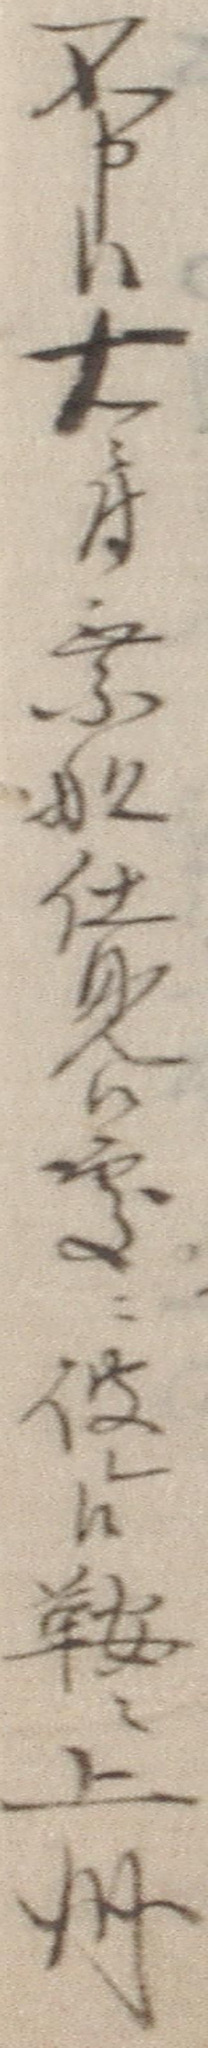不申候右ニ付乗舩仕見候処ニ破レ候鞍ニ上州
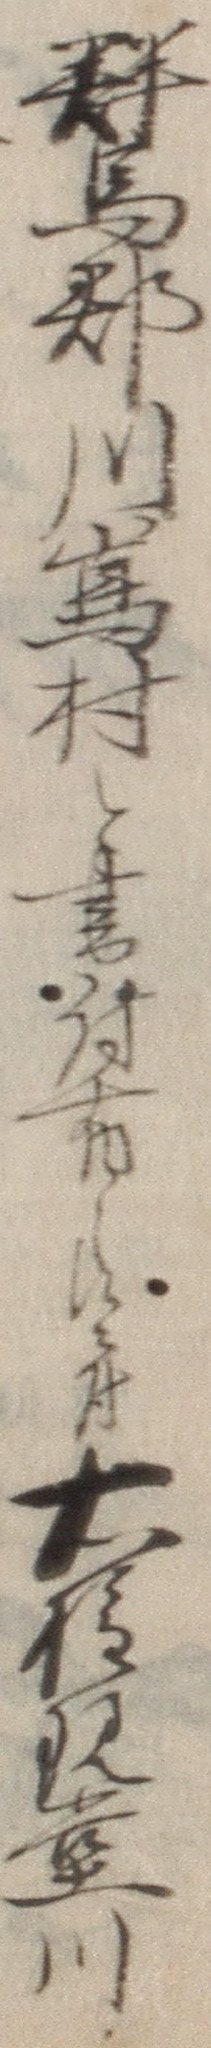群馬郡川嶋村と書付有之候ニ付右権現堂川
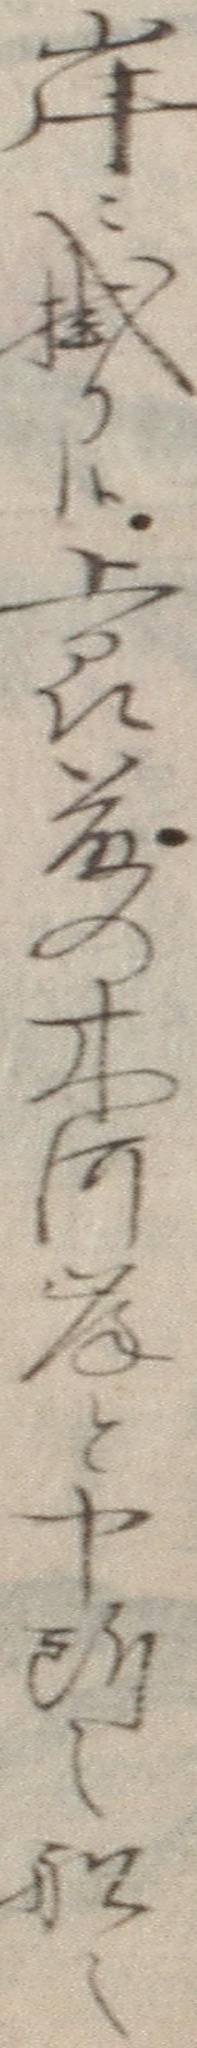岸ニ掛り候上州藤の木河岸と申所之舩之
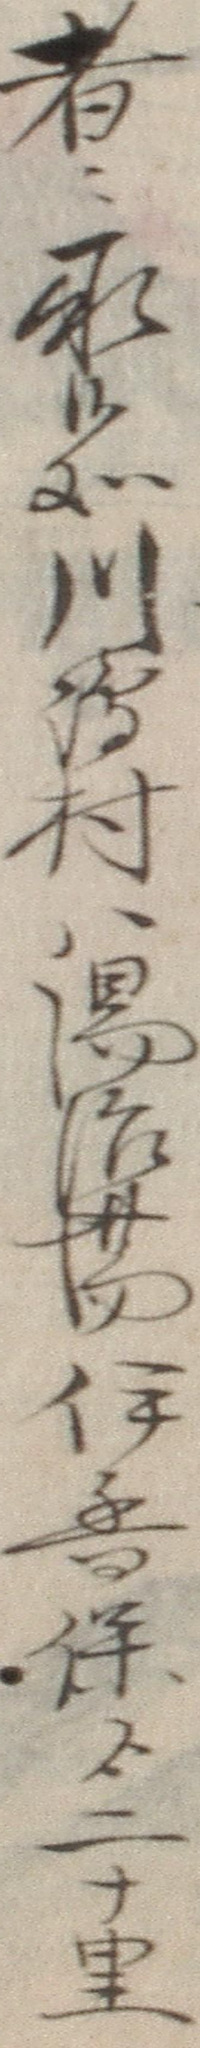者ニ承候処川嶋村は湯治場伊香保ゟ二十里
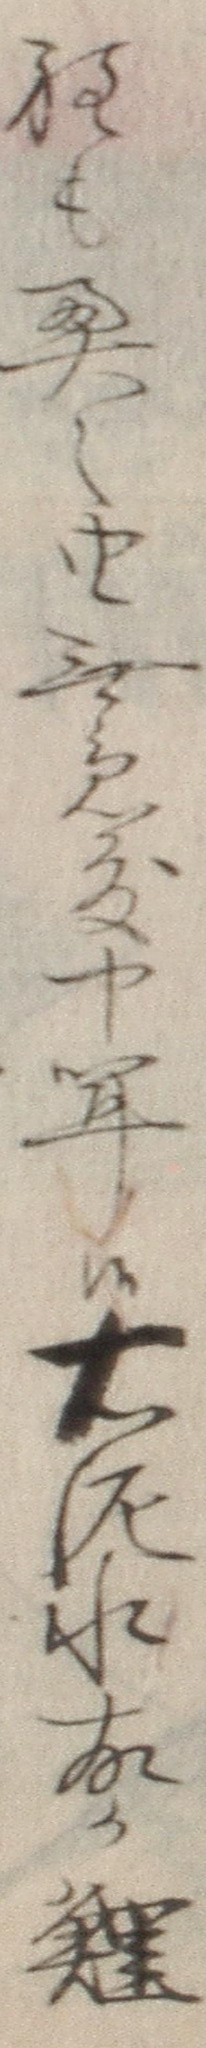程も奥之由無急度申聞候右泥水故か鯉
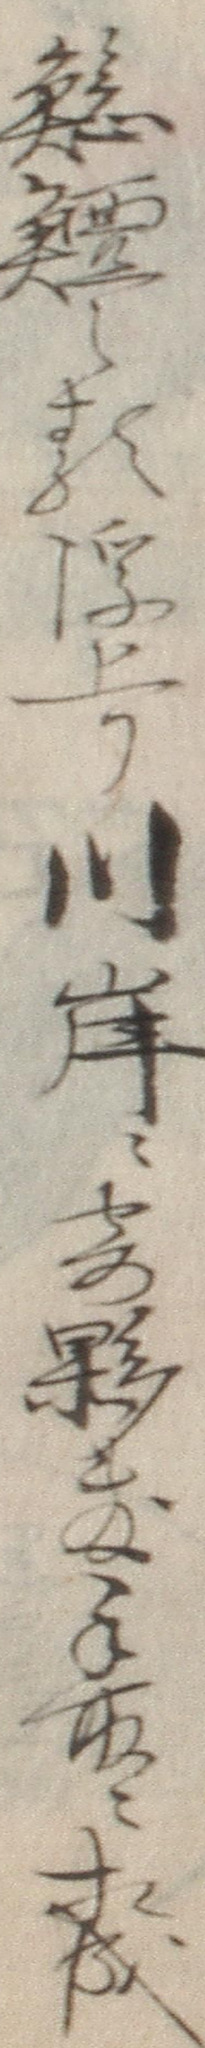鯰鱣之類浮上り川岸ニ寄夥敷手取ニ相成
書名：[諸国災害記録]
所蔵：東京大学地震研究所図書室 Earthquake Research Institute Library, The University of Tokyo, JAPAN
